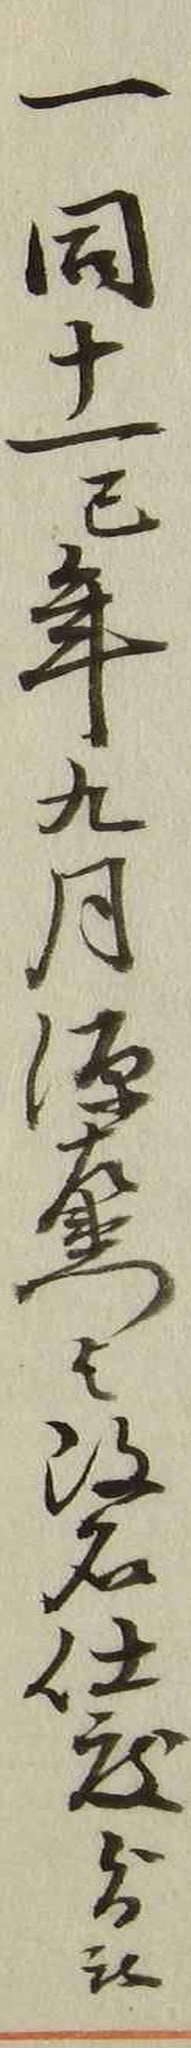一同十一巳年九月源左衛門与改名仕度旨被
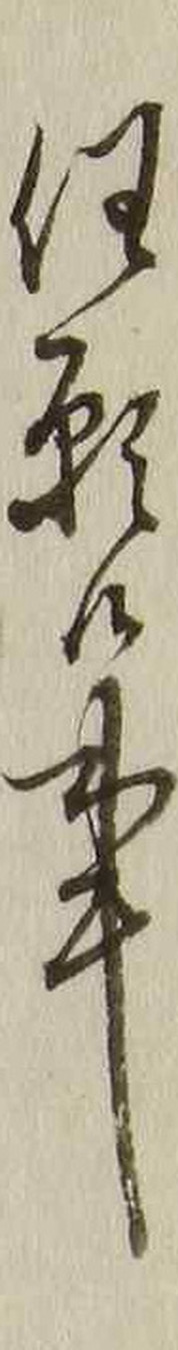任願候事
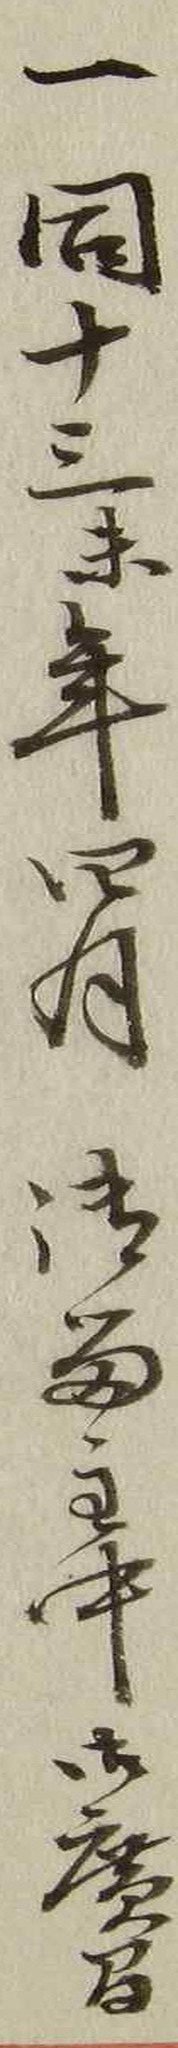一同十三未年四月御留主中御広間
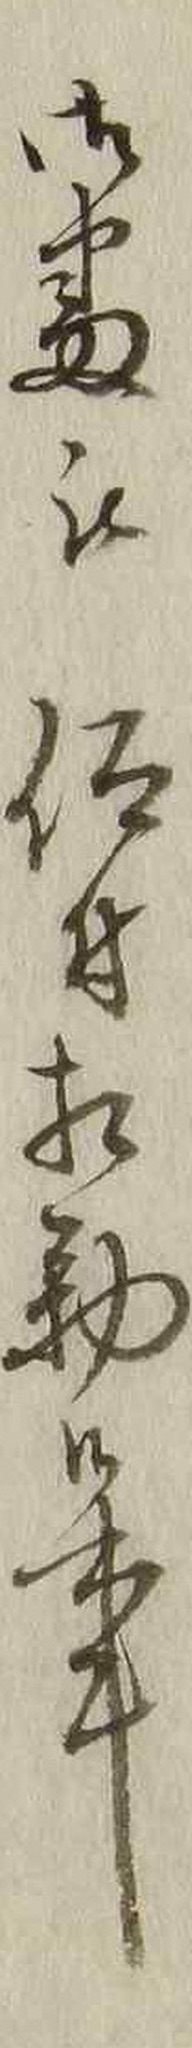御番被仰付相勤候事
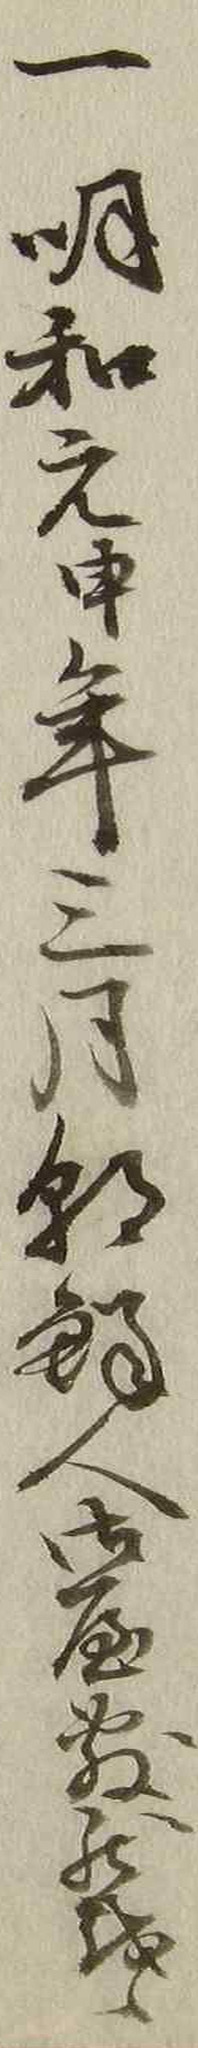一明和元申年三月朝鮮人御屋敷へ罷越候
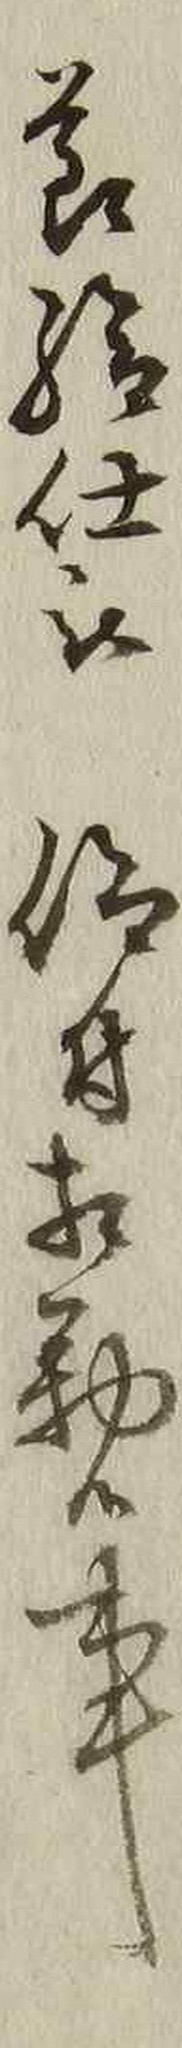節給仕被仰付相勤候事
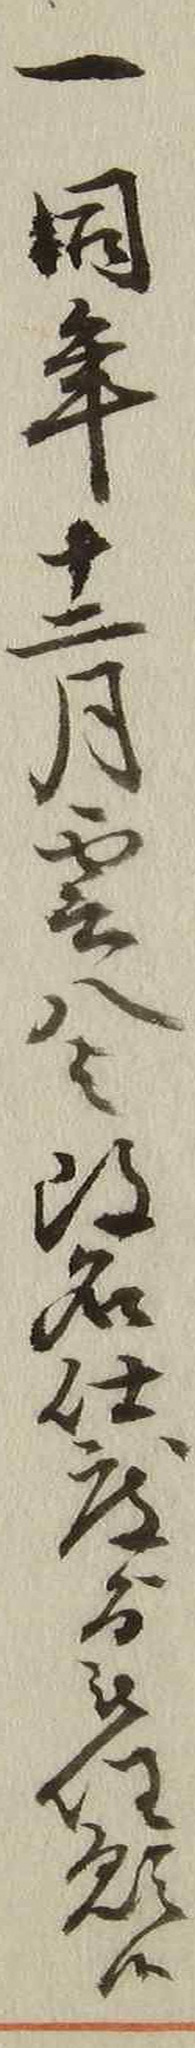一同年十二月雲八与改名仕度旨被任願候
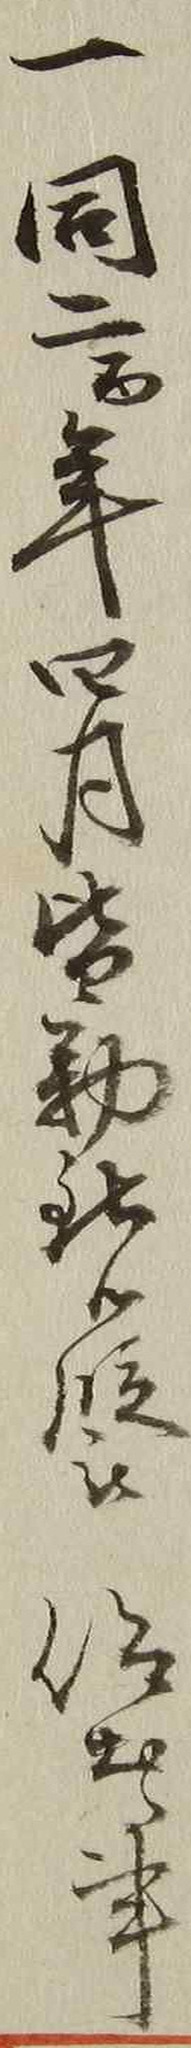一同二酉年四月皆勤致候段被仰出候事
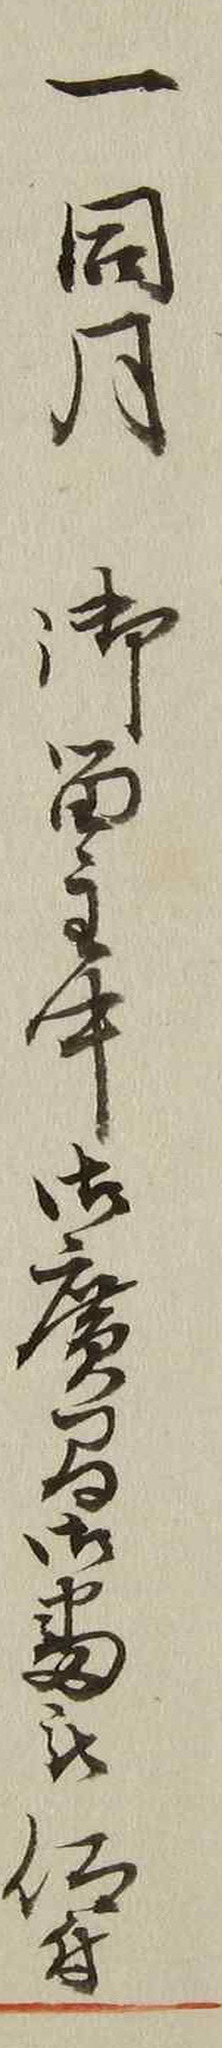一同月御留主中御広間御番被仰付
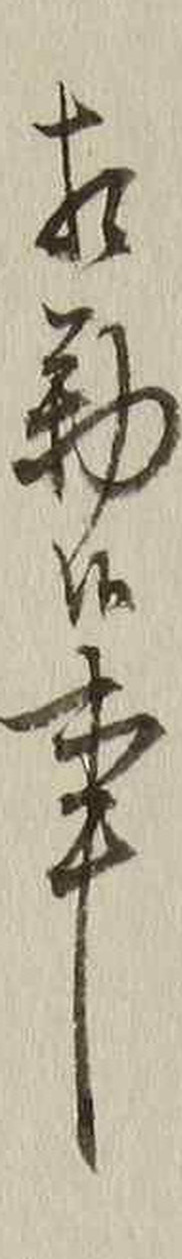相勤候事
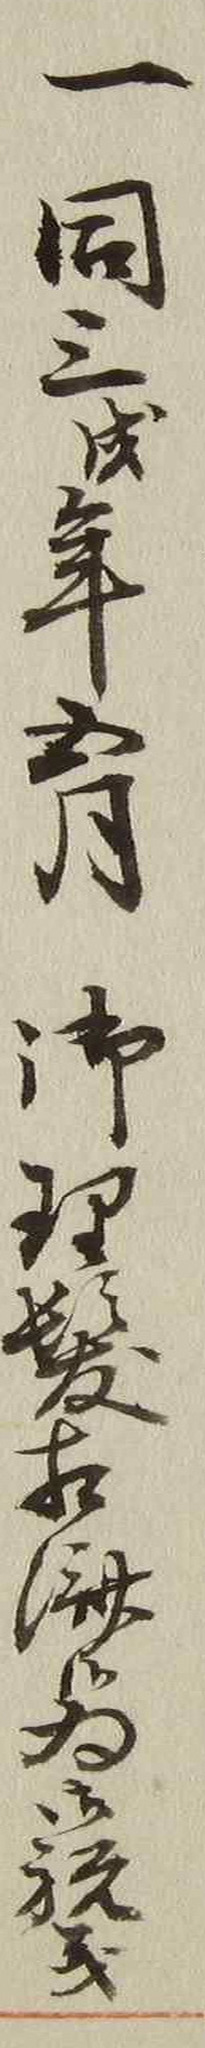一同三戌年五月御理髪相済候為御祝義
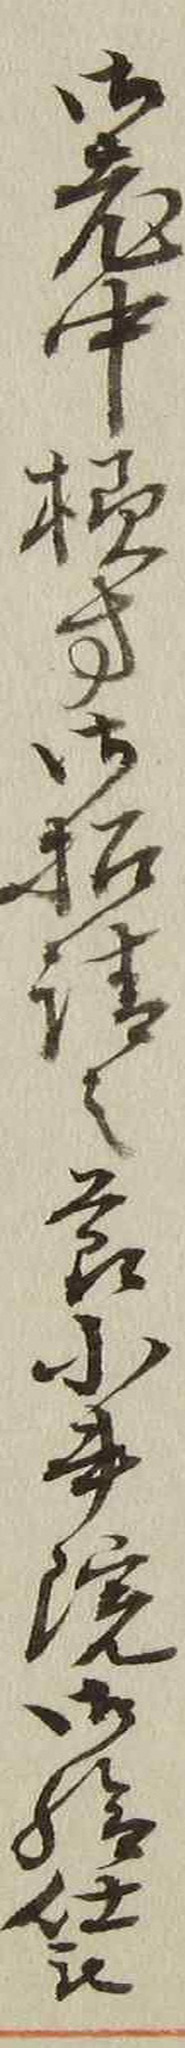御老中様方御招請之節小書院御給仕被
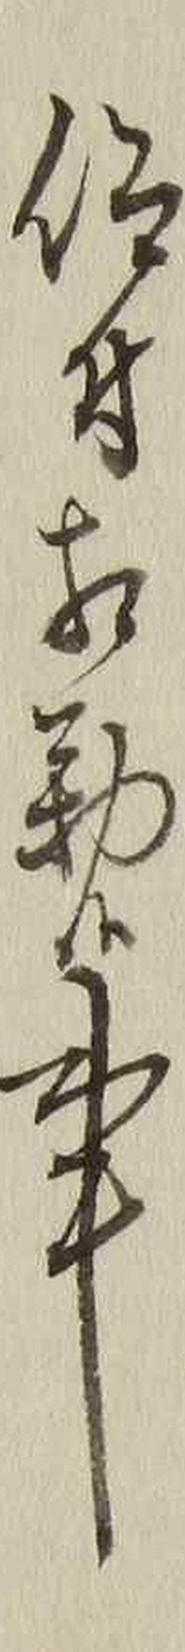仰付相勤候事
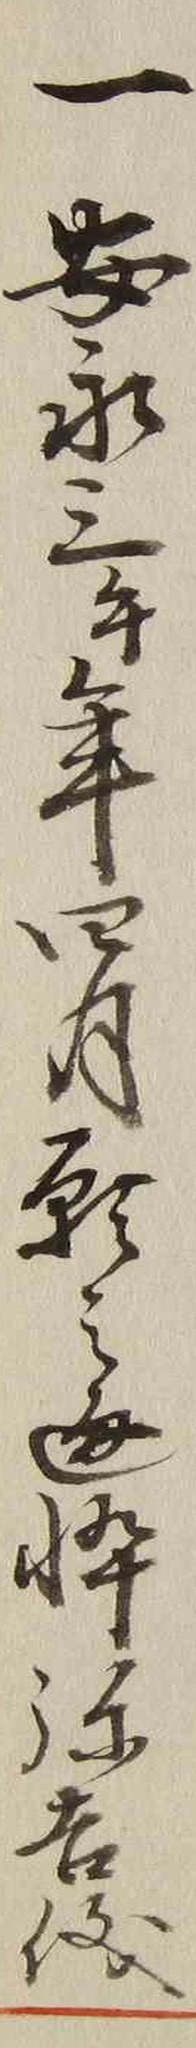一安永三午年四月願之通忰弥吉儀
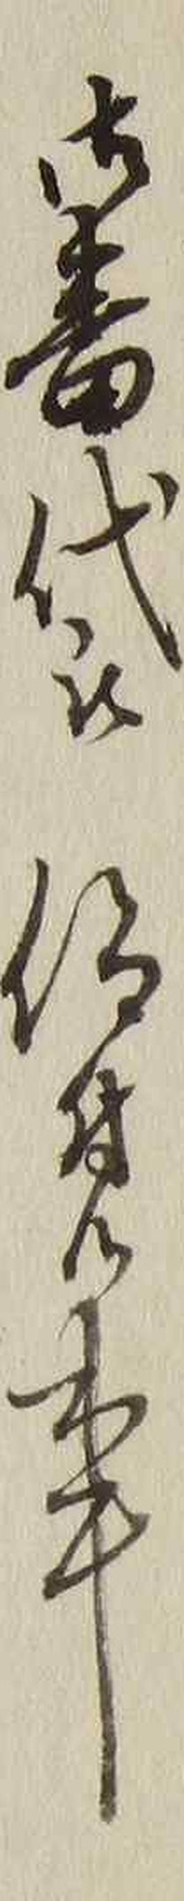御番代被仰付候事
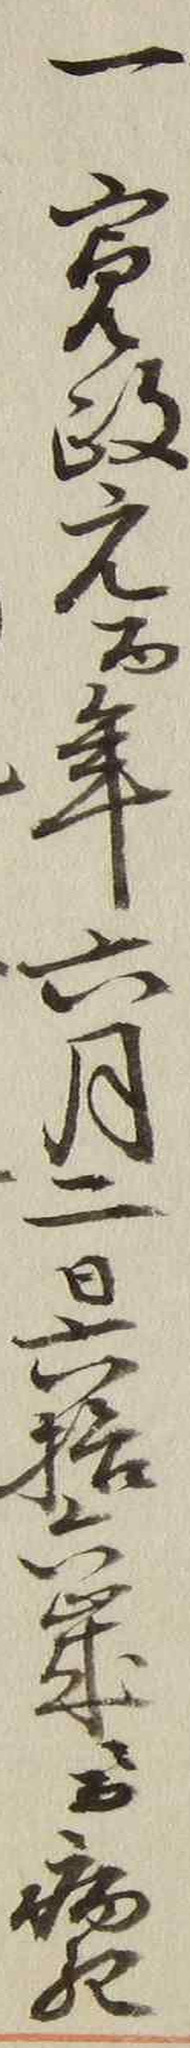一寛政元酉年六月二日六拾六歳ニ而病死
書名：諸士系譜　巻之23　い之部23
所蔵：会津若松市立会津図書館
